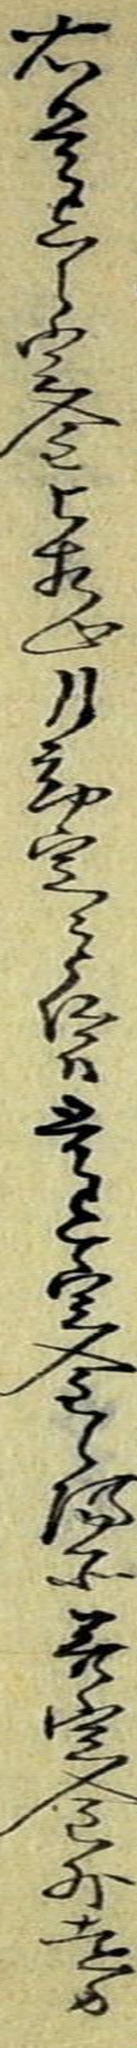右是迄之定金被相止月勘定に被仰付是迄定金之場所并定金外遠方
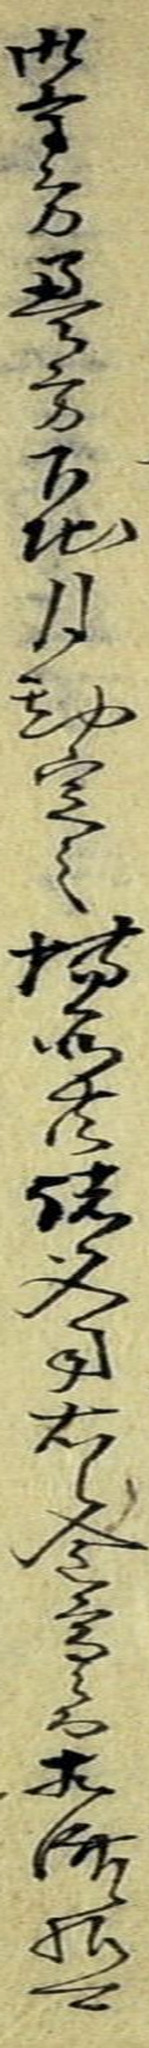御寺方畳方下地月勘定之場所共諸御入用右之金高に而相済候様可
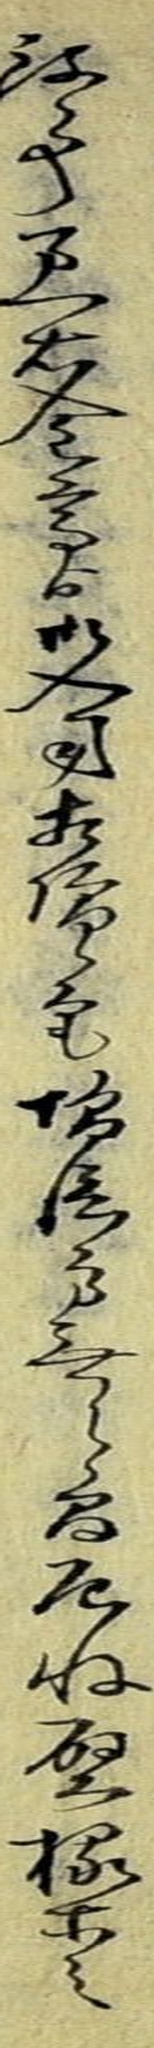致事万一右金高ゟ御入用相増候而も増渡方無之候間やね壁椽等之
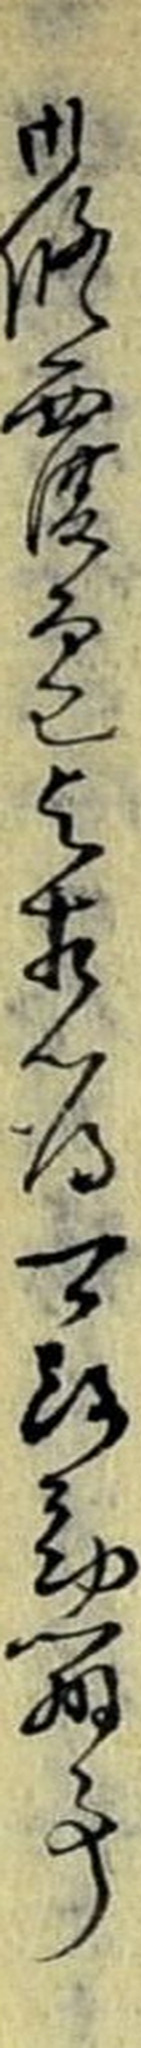御修覆而己と相心得可致勘弁事
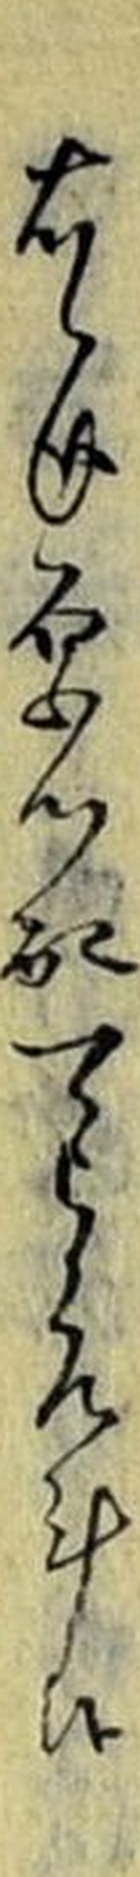右之趣厚心配可被取斗候
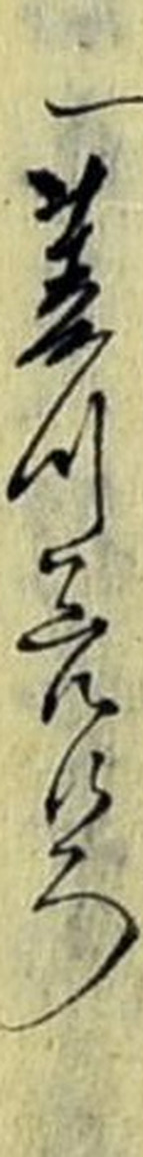菱川善左衛門
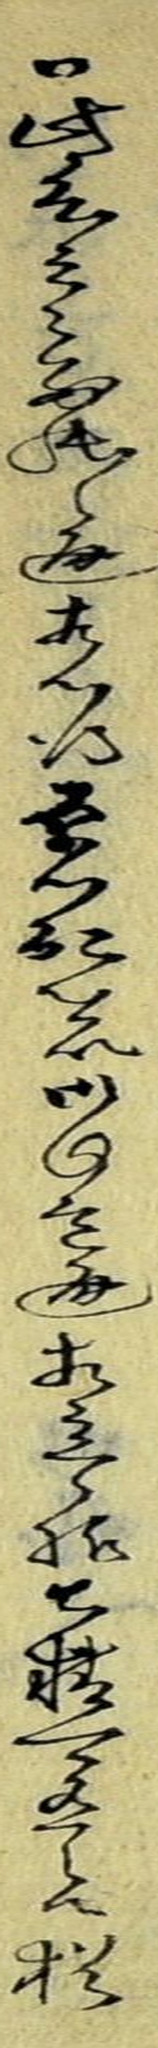○此度云々別紙之通相心得厚心配を以御趣意通相立候様出精可有之候猶
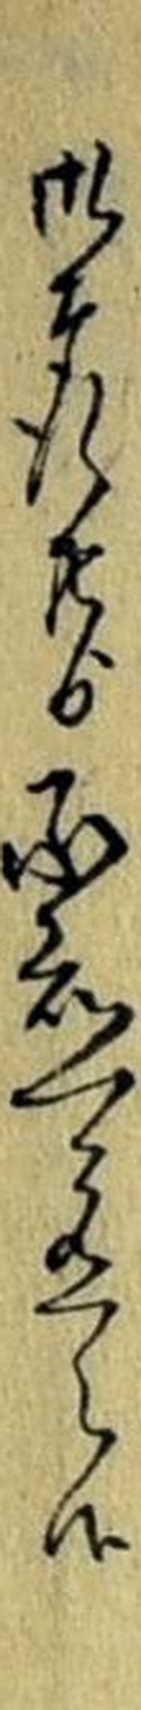御奉行共ゟ承知可被有之
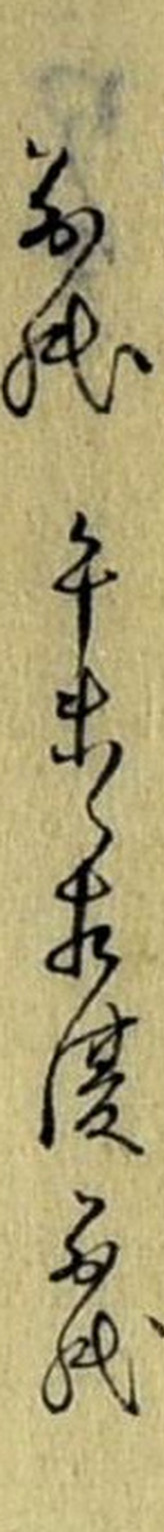別紙午未へ相復別紙

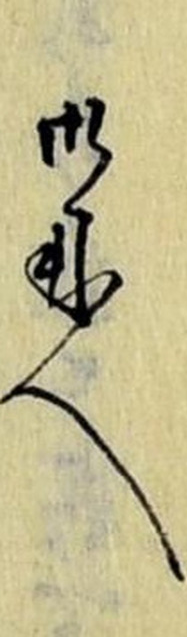御用人
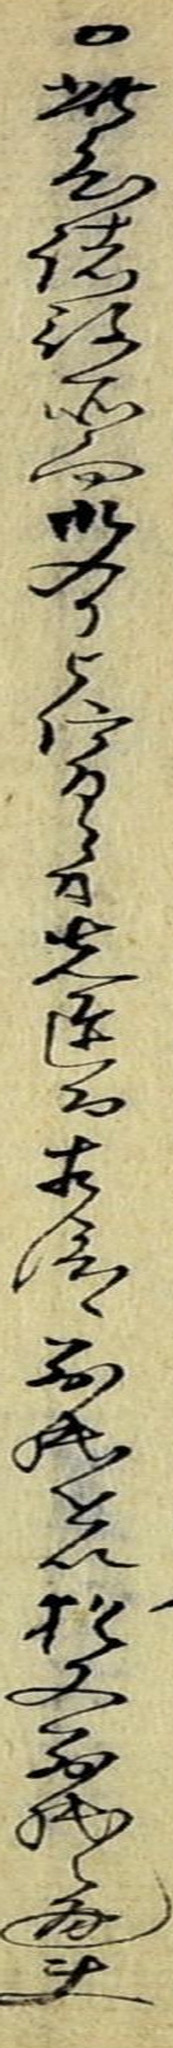○此度諸役所向御〆り被仰付先達而相渡候別紙を以猶又別紙之通夫
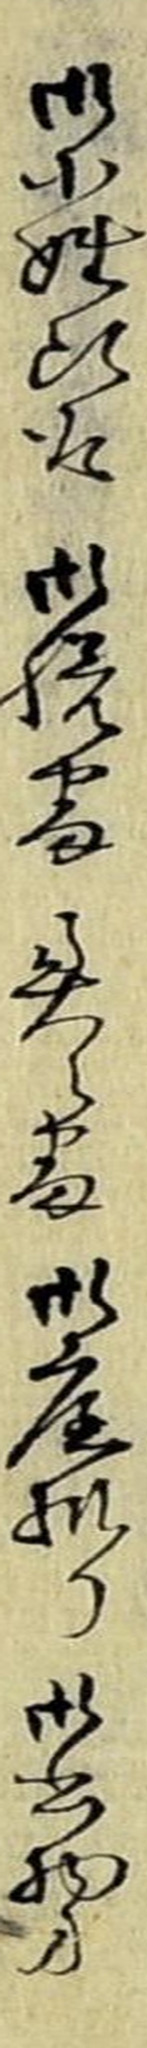御小姓頭取御膳番奥之番御庭掛り御書物方
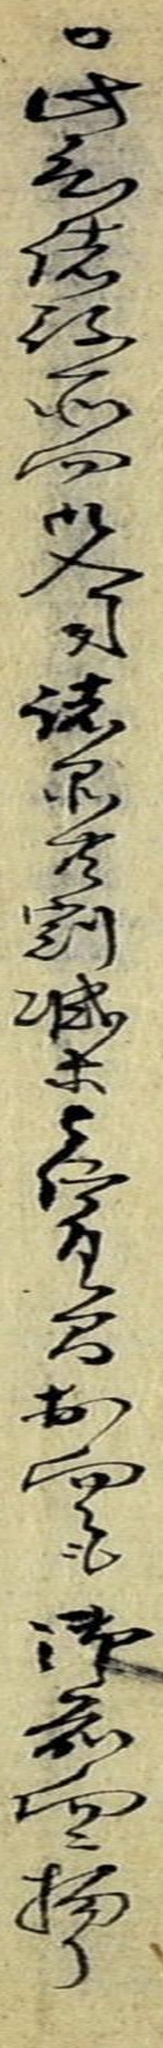○此度諸役所向御入用諸品共割減等被仰付候間於向々も御前向に拘り
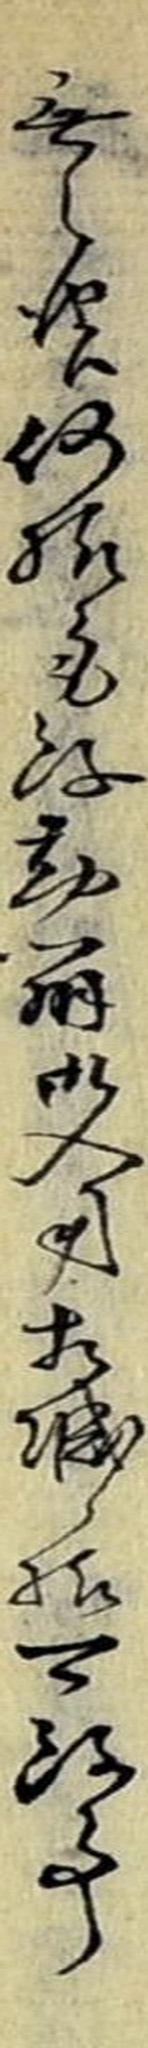無之儀は何様にも致勘弁御入用相減候様可致事
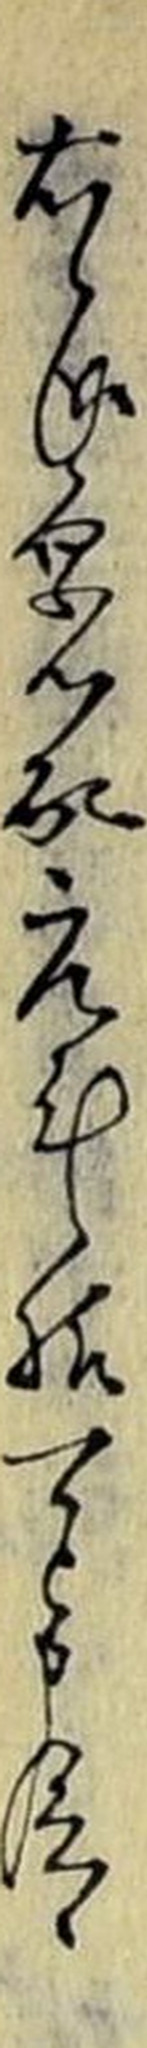右之趣厚心配取斗候様可被申渡候
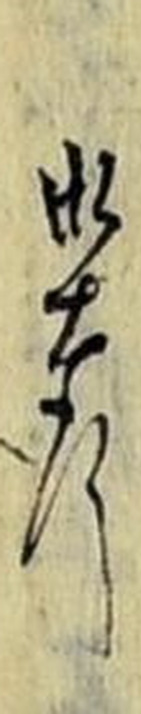御奉行
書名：命令之部 四
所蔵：福井県文書館 Fukui Prefectural Archives
